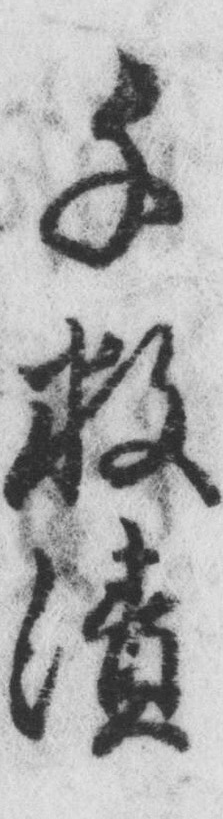千枚漬
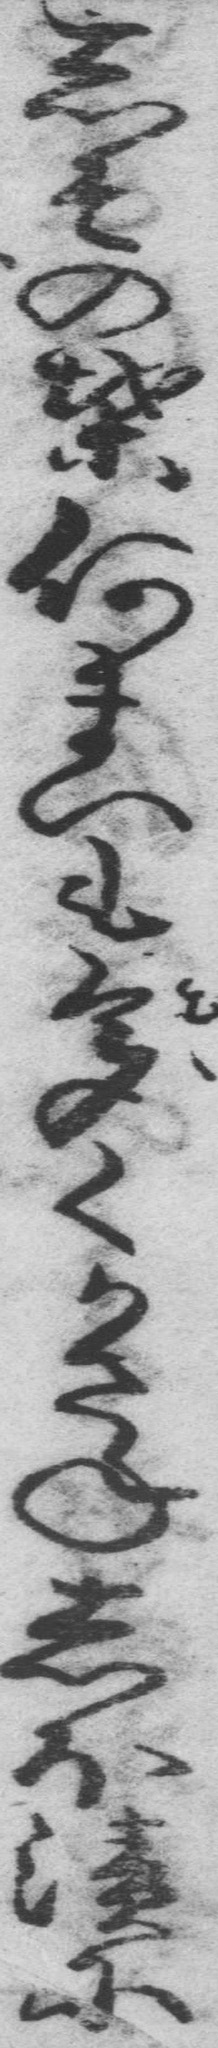しその葉何まいも多くかさねしほ漬に
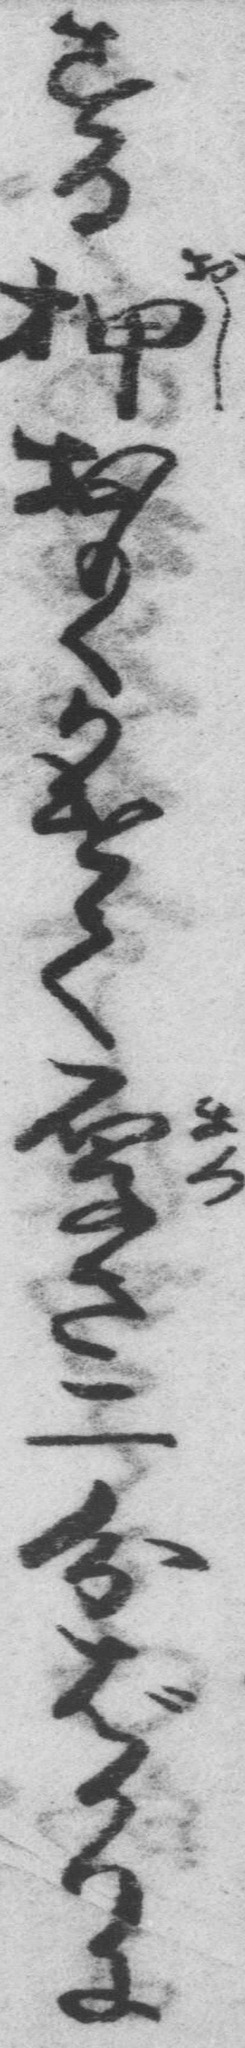する押おもくかけて厚さ二分ばかりに
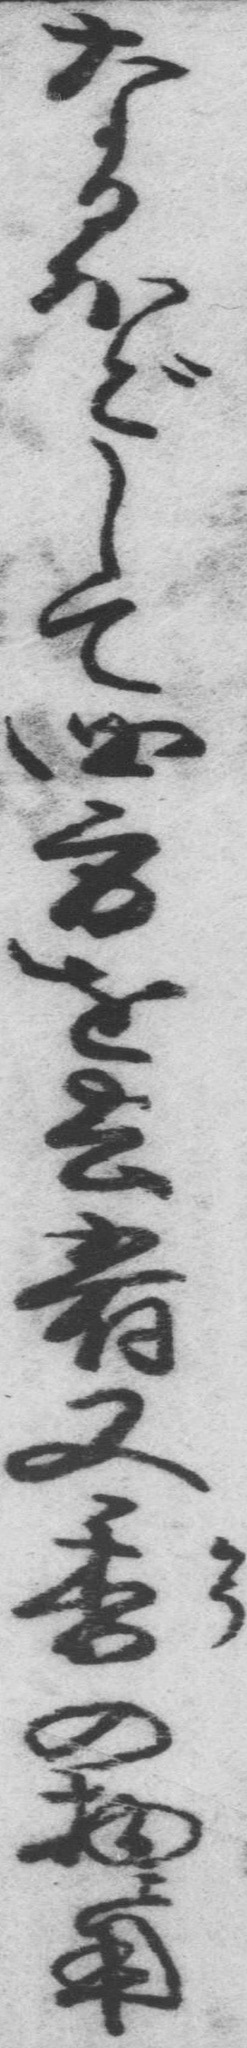なるほどして四方を去肴又香の物に用
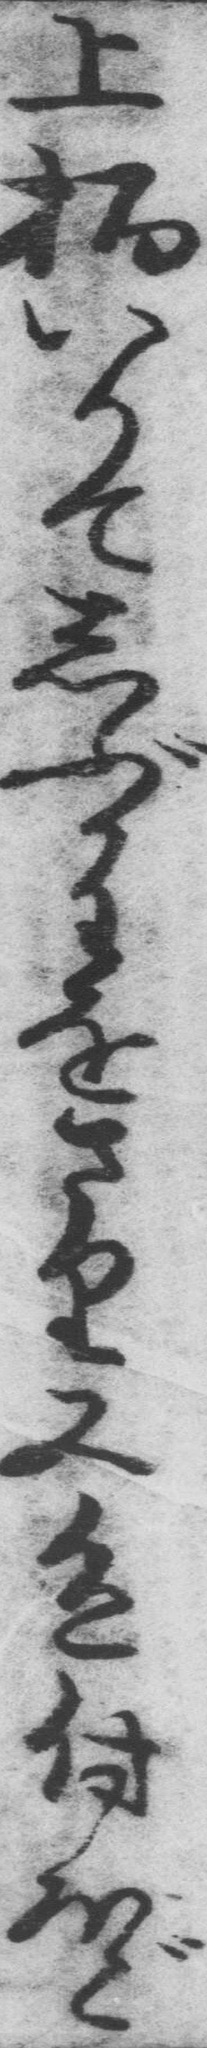上栢いりてしぶかわをさり又色付ほど
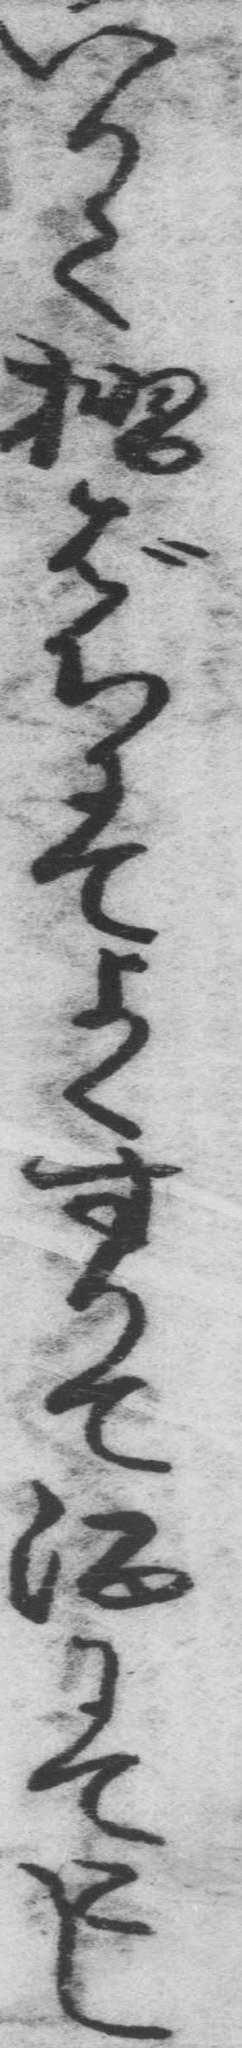いりて摺ばちにてよくすりて酒にてこし
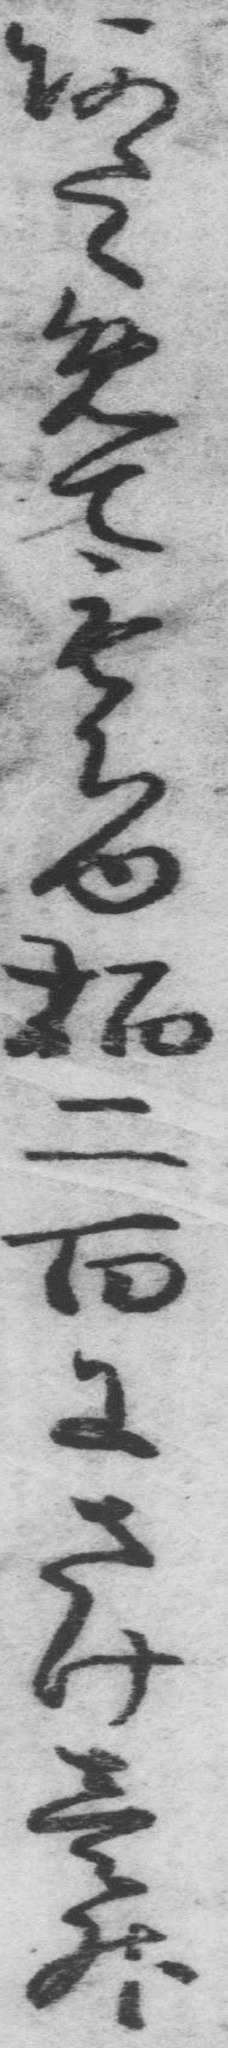あたゝめてもちゆ栢二百にさけ壱升
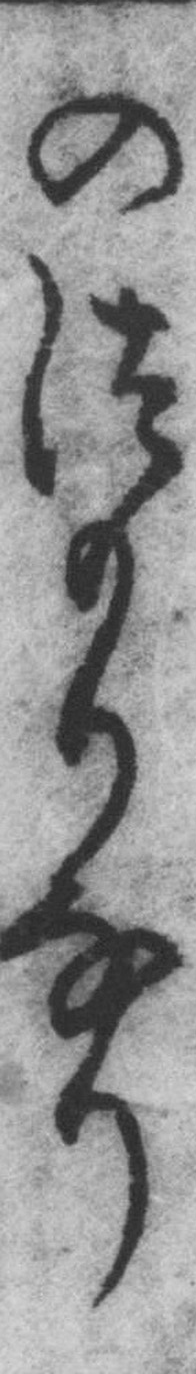のつもりなり

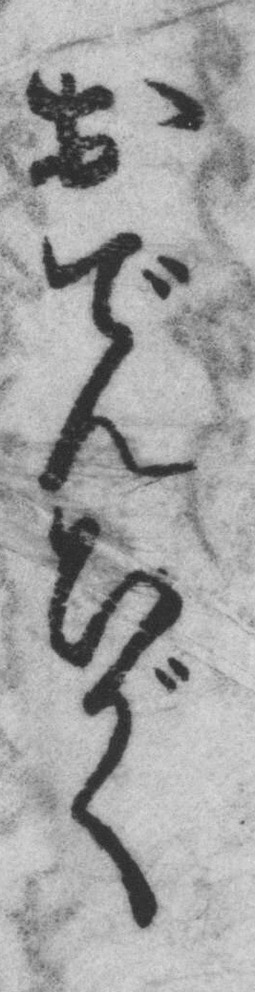おでんひがく
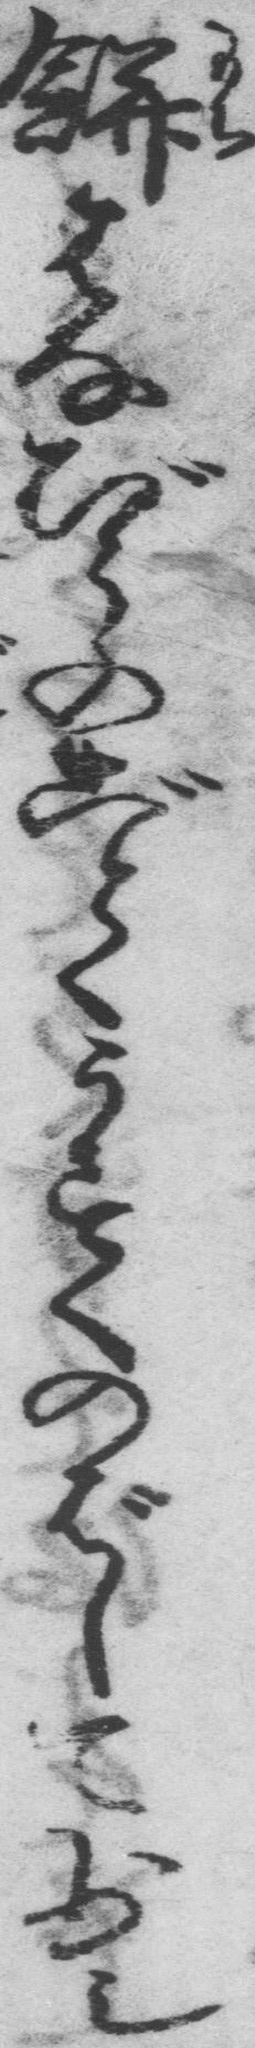餅はなびらのごとくうすくのばして少し
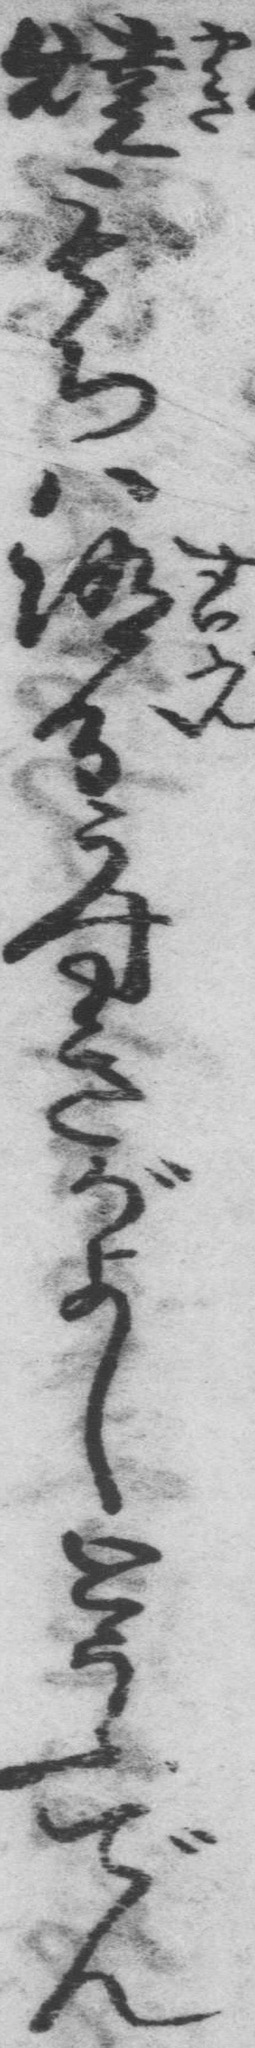焼もちは随分うすきがよしとうふでん
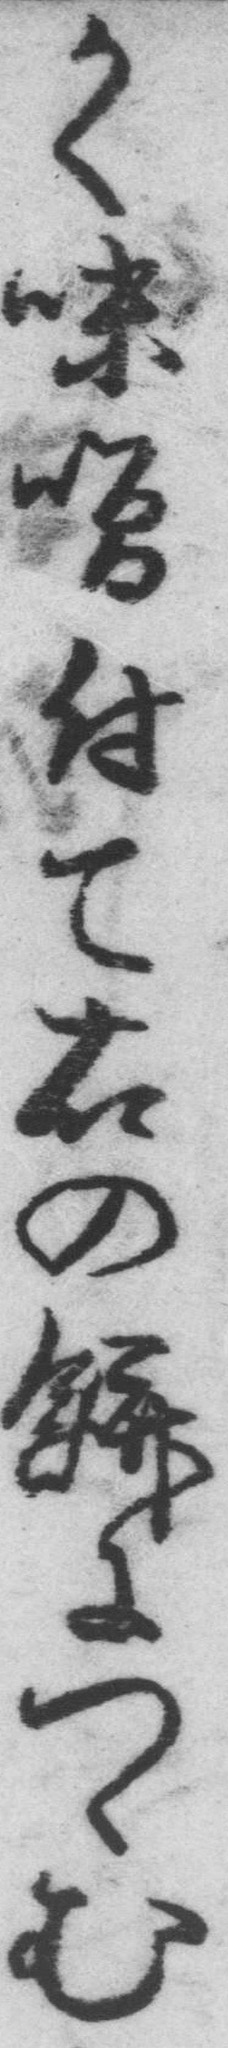かく味噌付て右の餅につゝむ
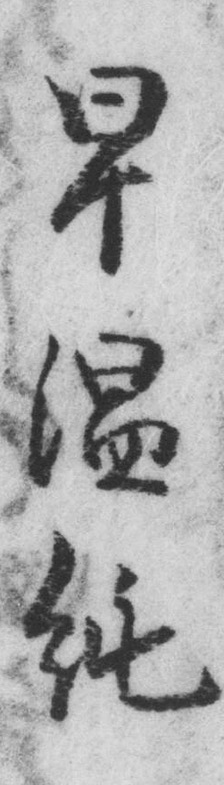早饂飩
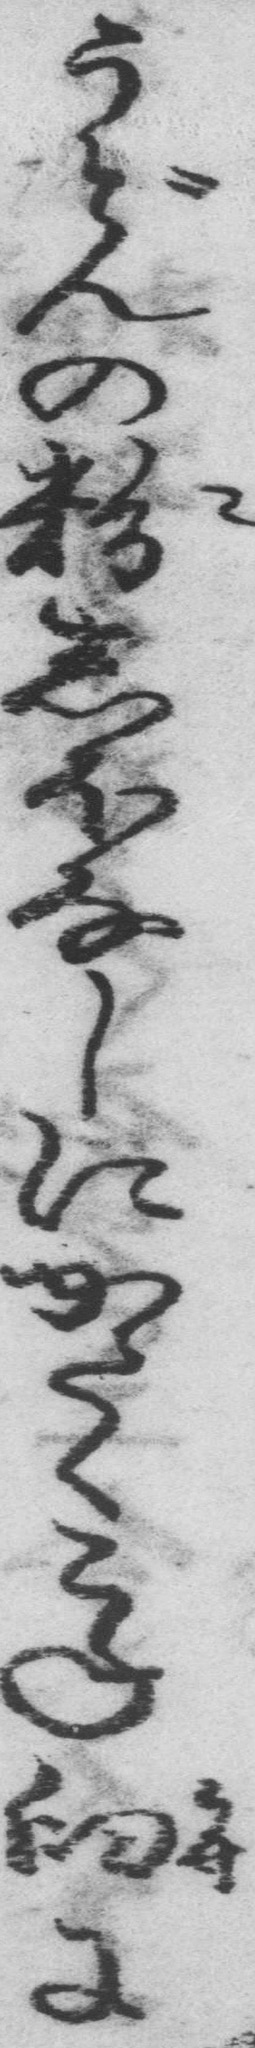うどんの粉しほなしにかたくこね臼に
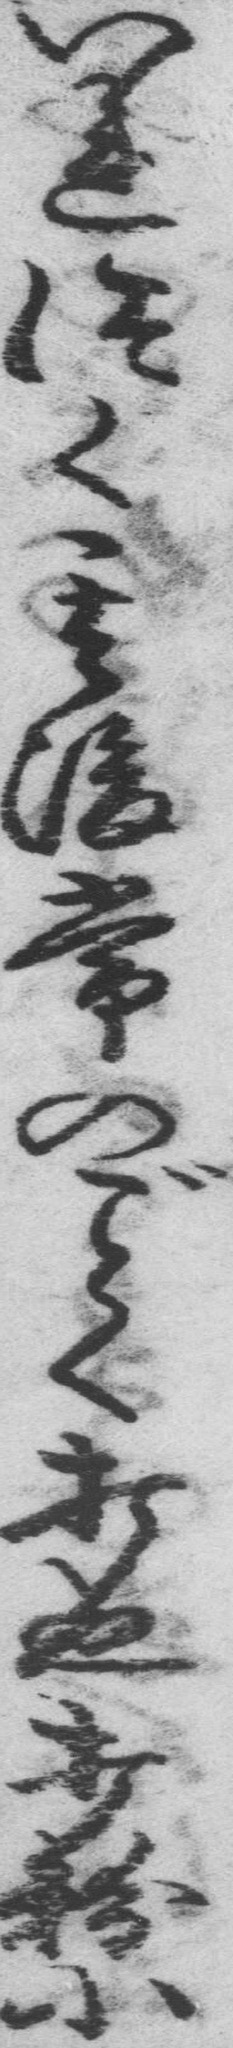いれつく其後常のごとく打返打粉に
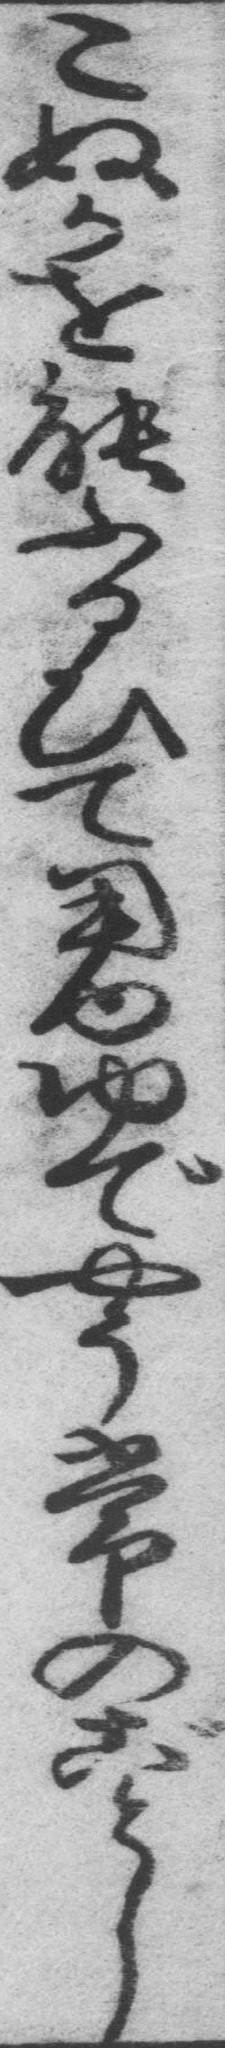こぬかを能ふるひて用ゆゆでやう常のごとし
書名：料理山海郷
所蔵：大阪府立大学学術情報センター 国文学研究資料館
